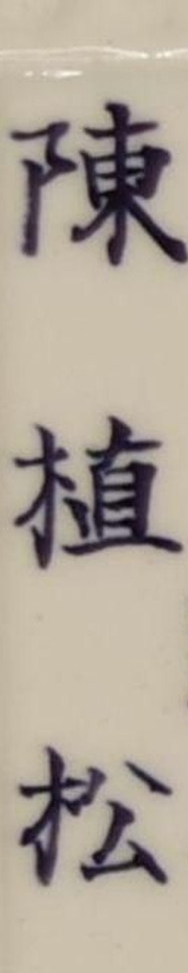陳植松

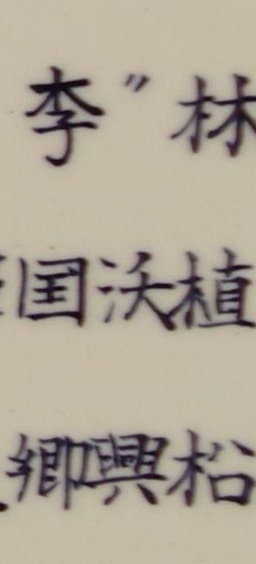李国郷
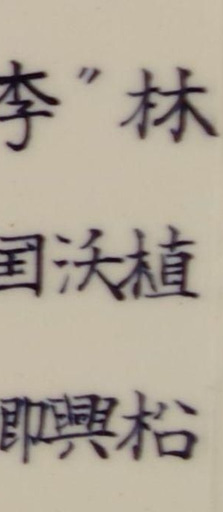林植松
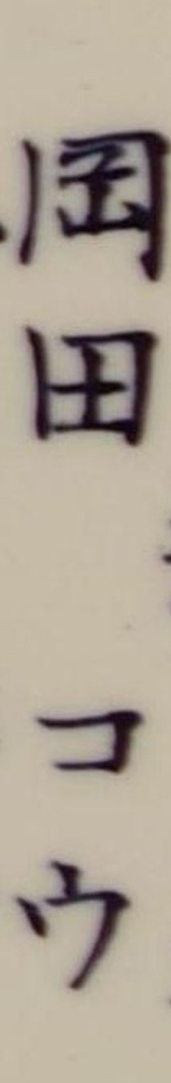岡田コウ
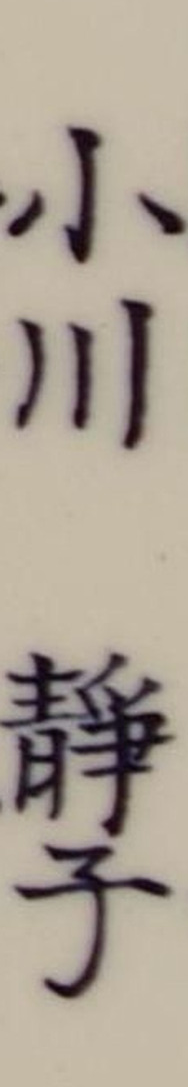小川静子
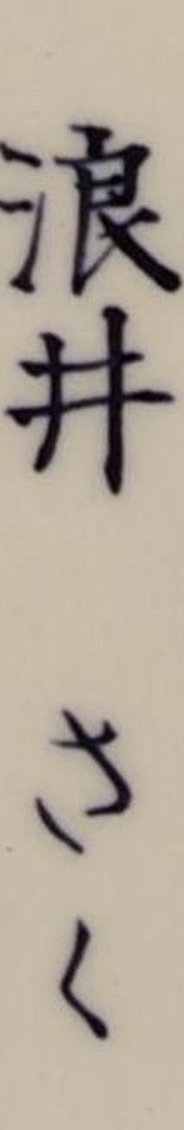浪井さく
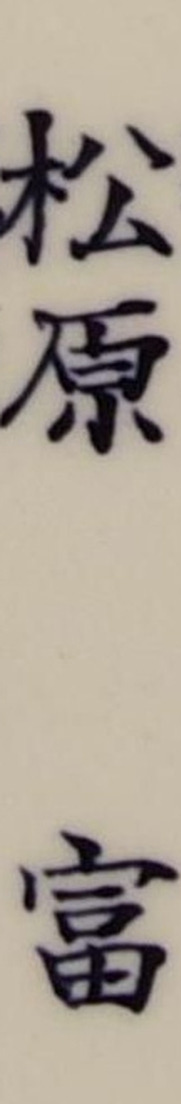松原富
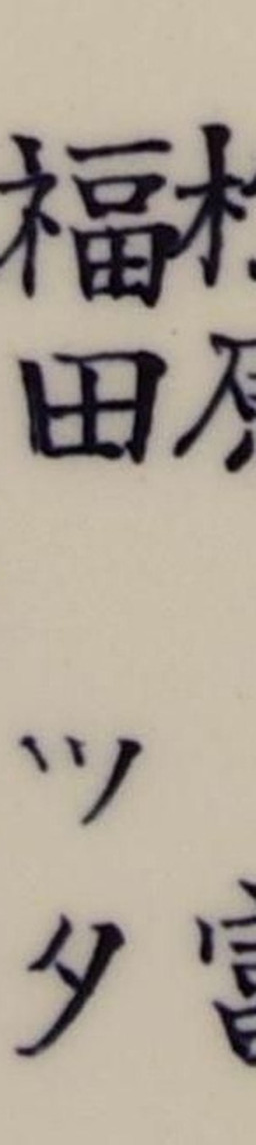福田ツタ
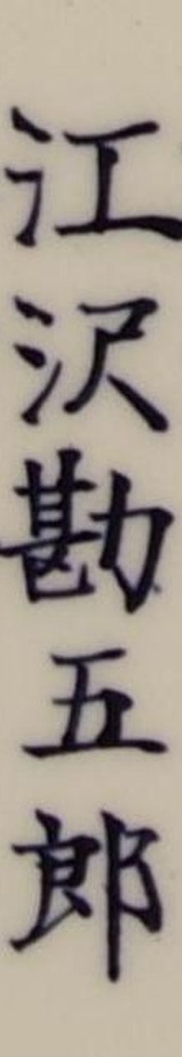江沢勘五郎
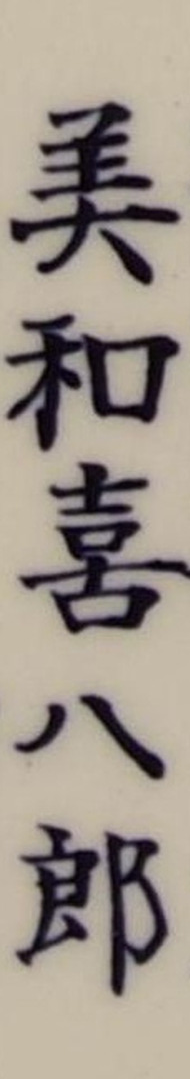美和喜八郎
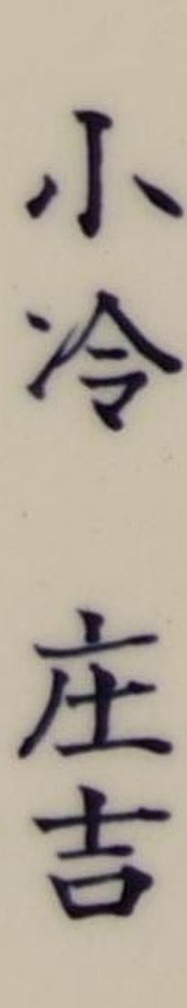小冷庄吉
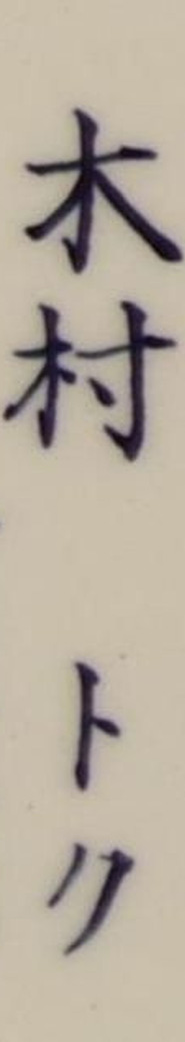木村トク
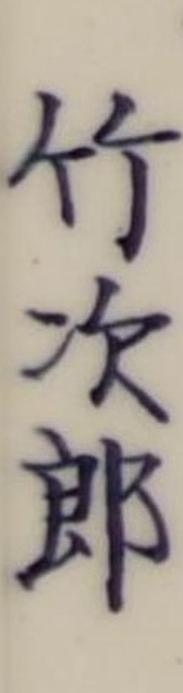竹次郎

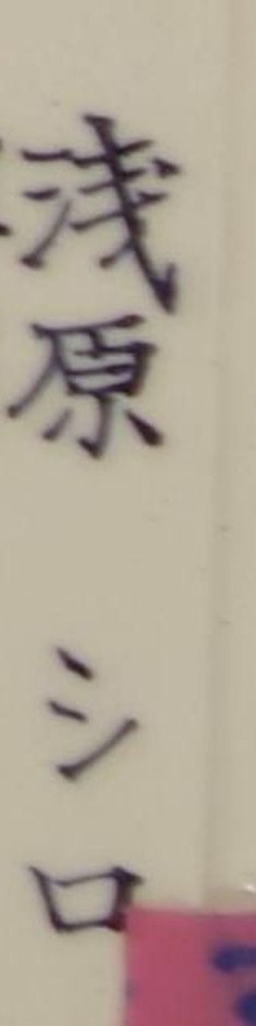浅原シロ
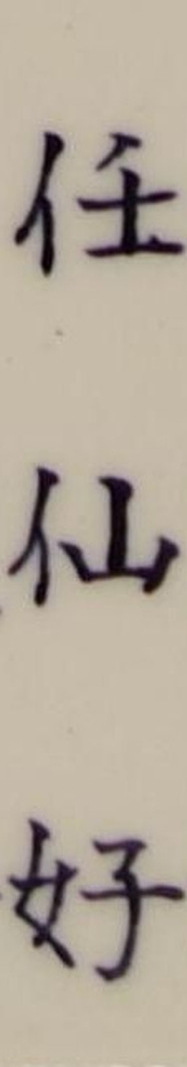任仙好
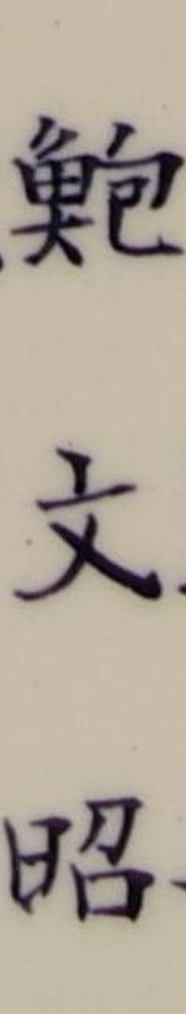鮑文昭
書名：M~S
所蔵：高野山金剛峯寺
